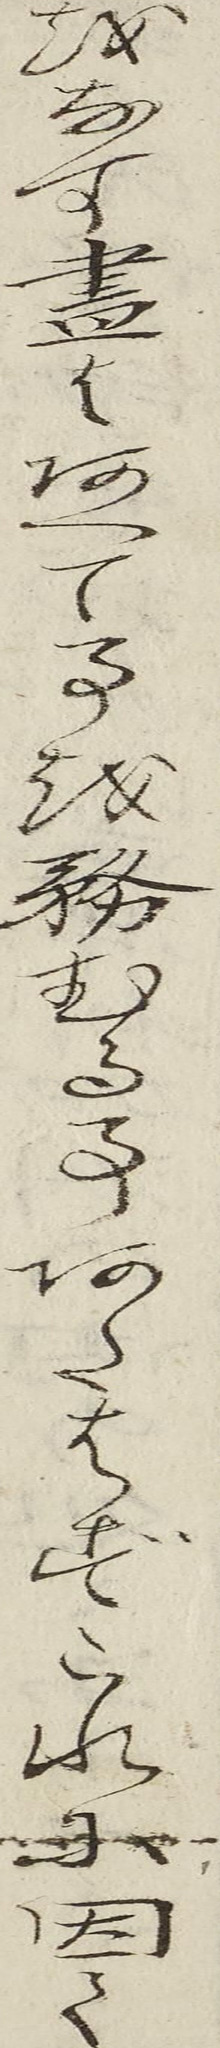をなす昼はあへて事を務むる事あたはずこれに因て
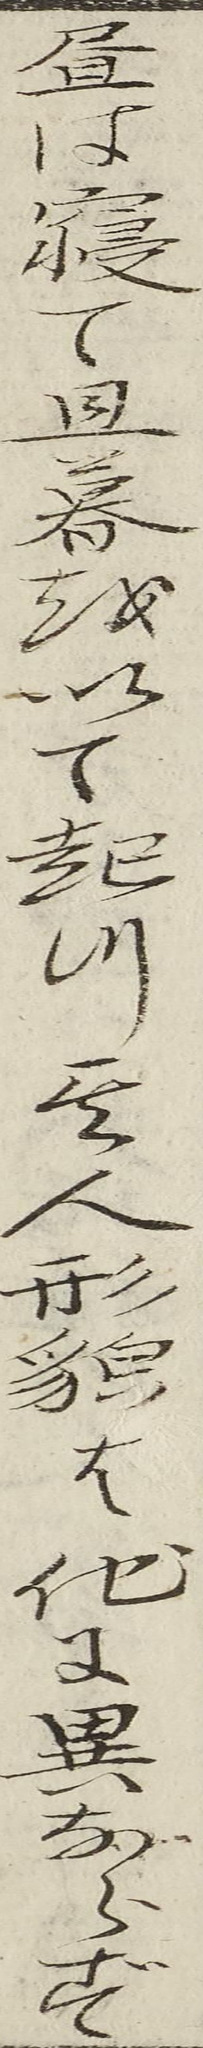昼は寝て且暮を以て起つ其人形貌は他に異ならず
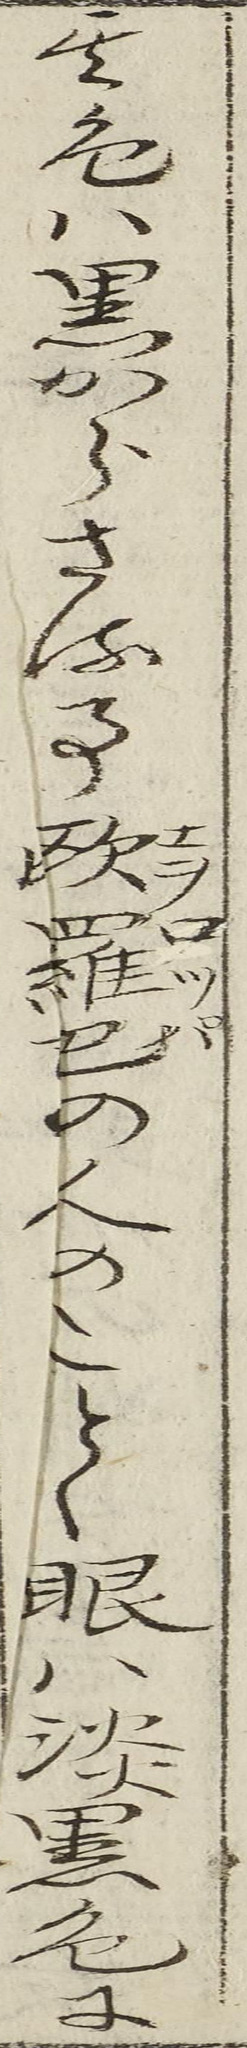其色は黒からさる事欧羅巴の人のことく眼は淡黒色に
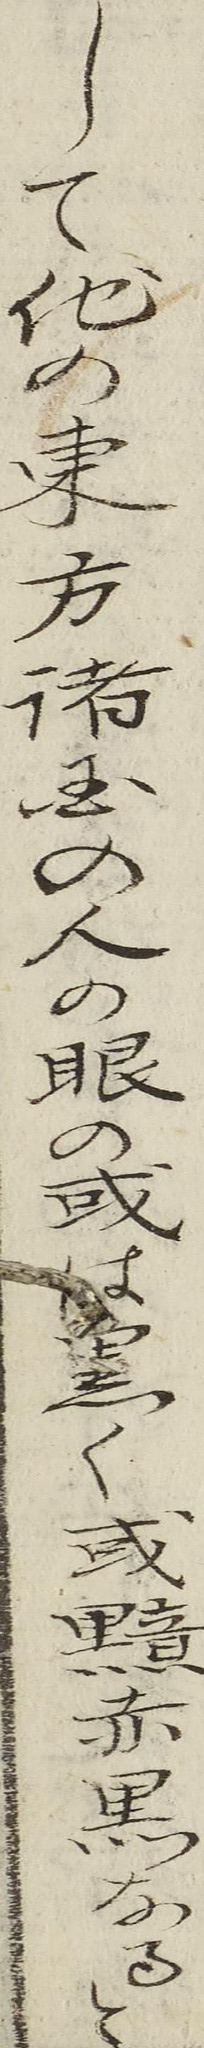して他の東方諸国の人の眼の或は黒く或黯赤黒なると

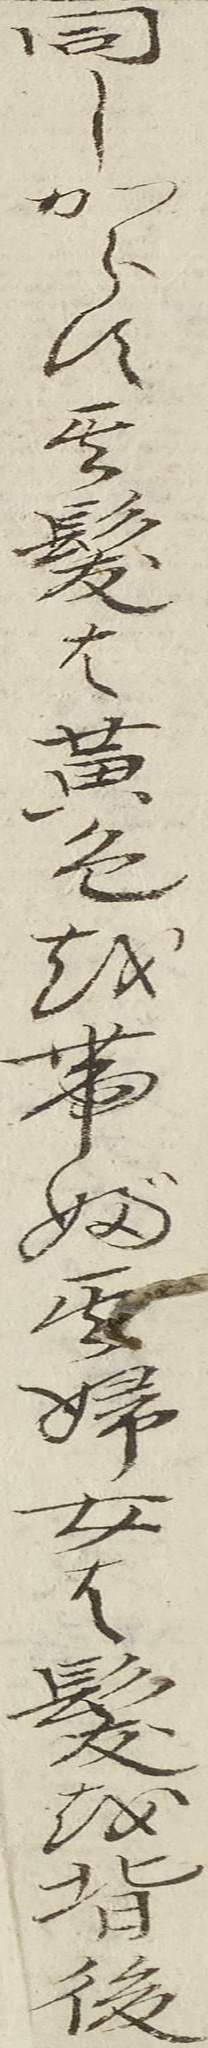同しからす其髪は黄色を帯ぶ其婦女は髪を背後
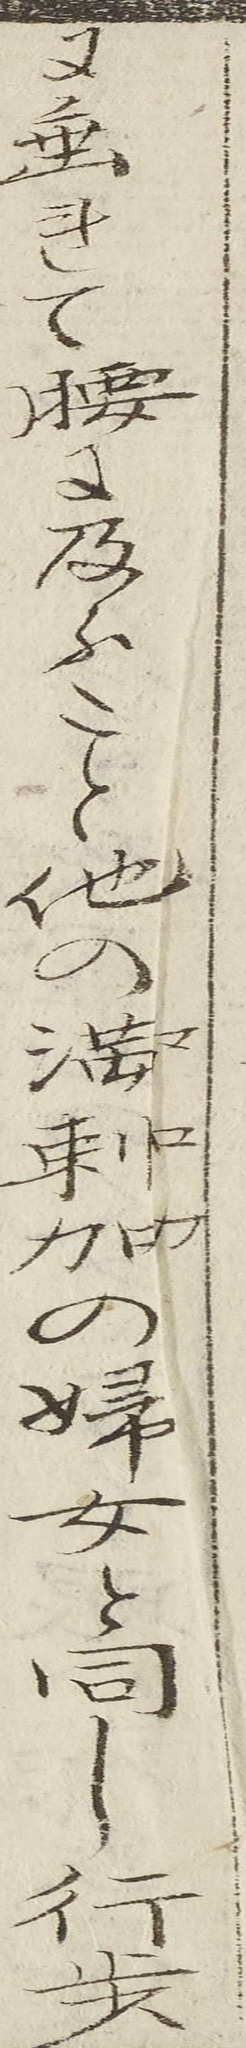に垂れて腰に及ふこと他の満刺加の婦女と同し行歩
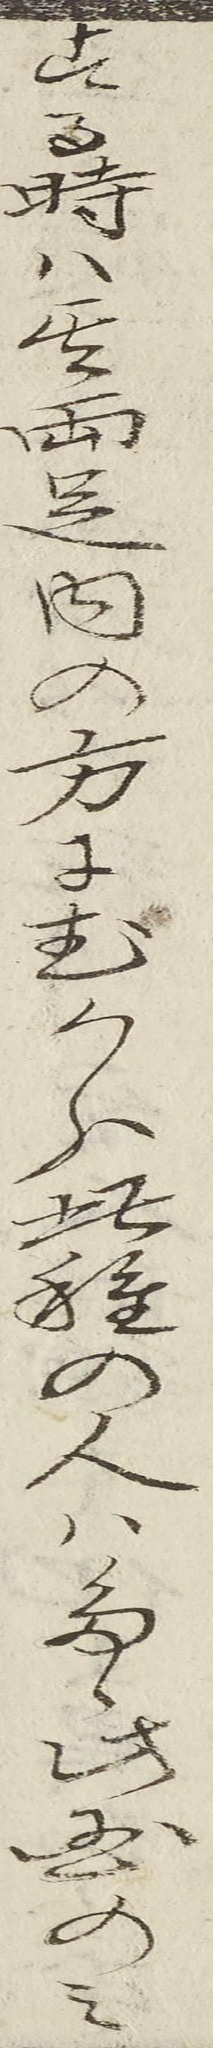する時は其両足内の方にむかふ此種の人は多く此国のみ
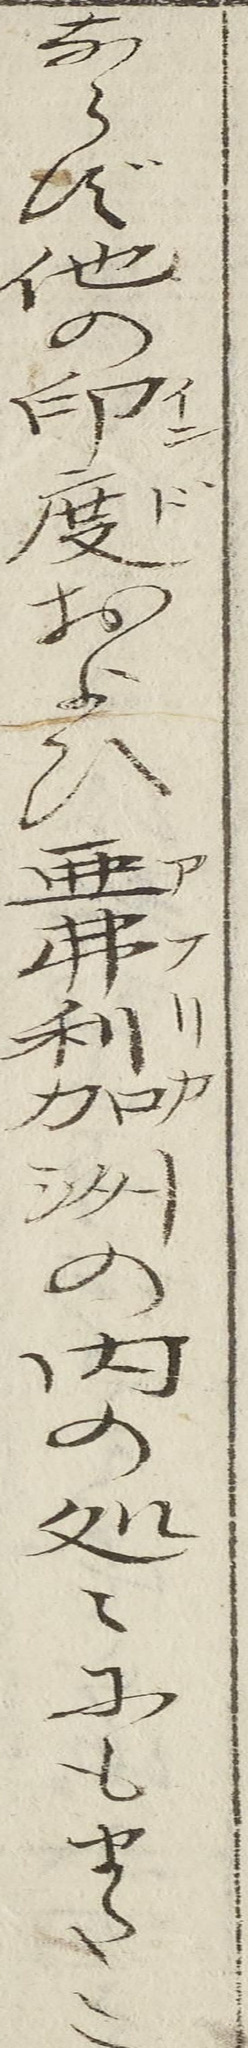ならず他の印度およひ亜弗利加洲の内の処〻にもまたこ
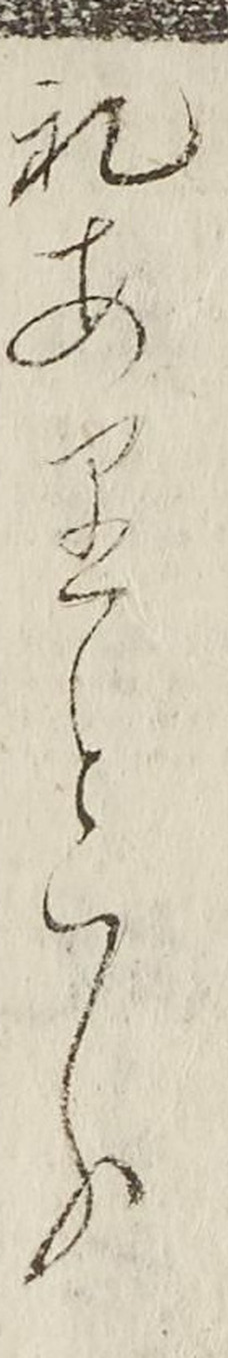れありといふ
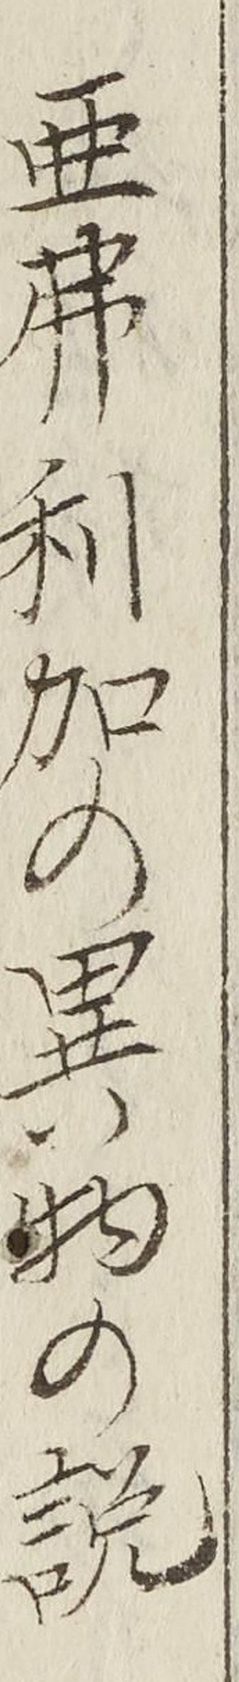亜弗利加の異物の説
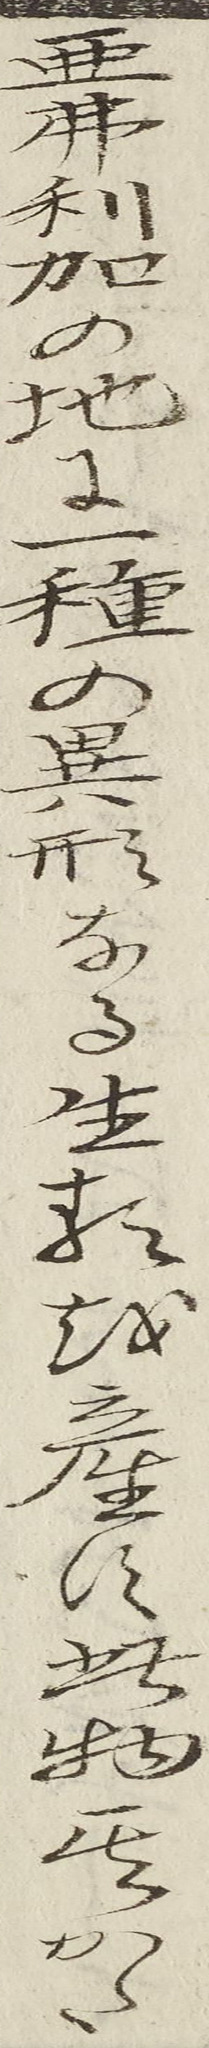亜弗利加の地に一種の異形なる生類を産す此物其かた
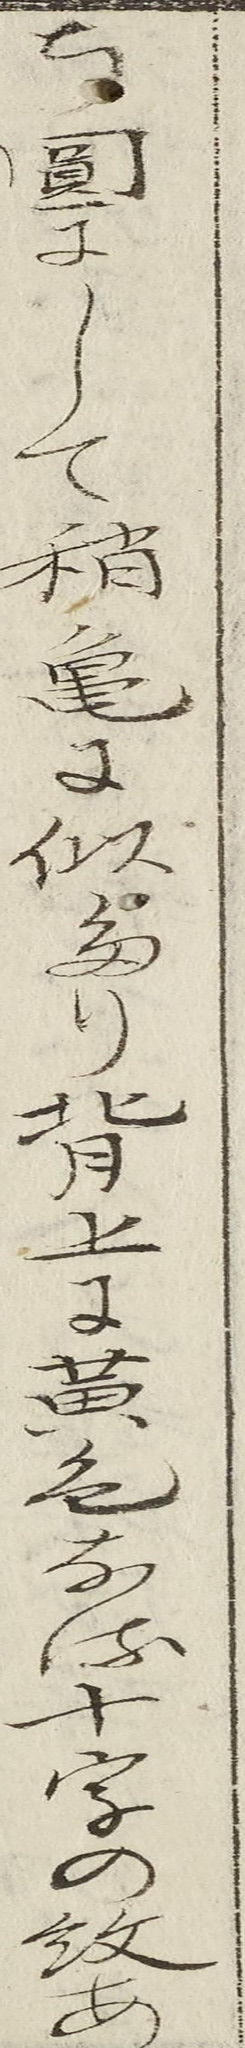ち円にして稍亀に似たり背上に黄色なる十字の紋あ
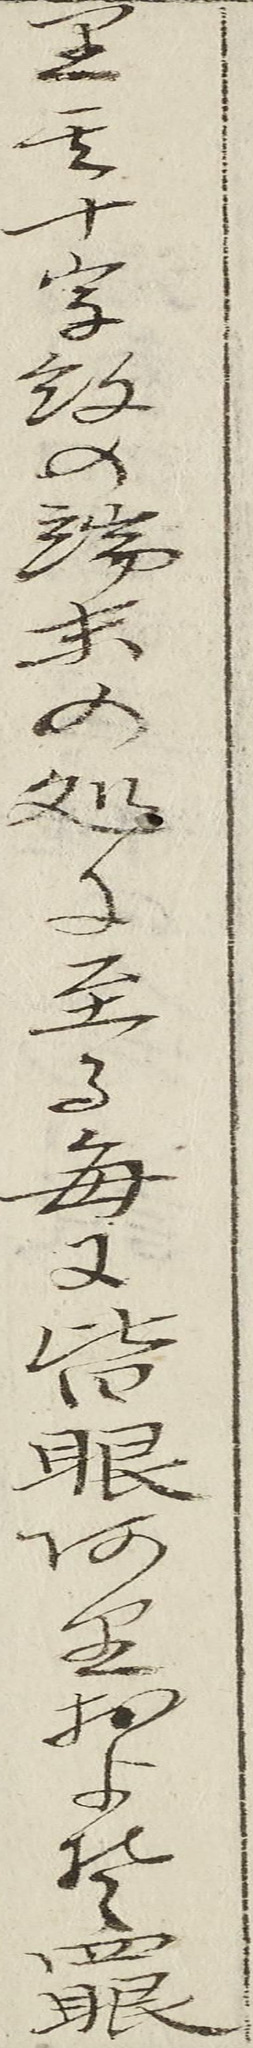り其十字紋の端末の処に至る毎に皆眼ありおよそ四眼
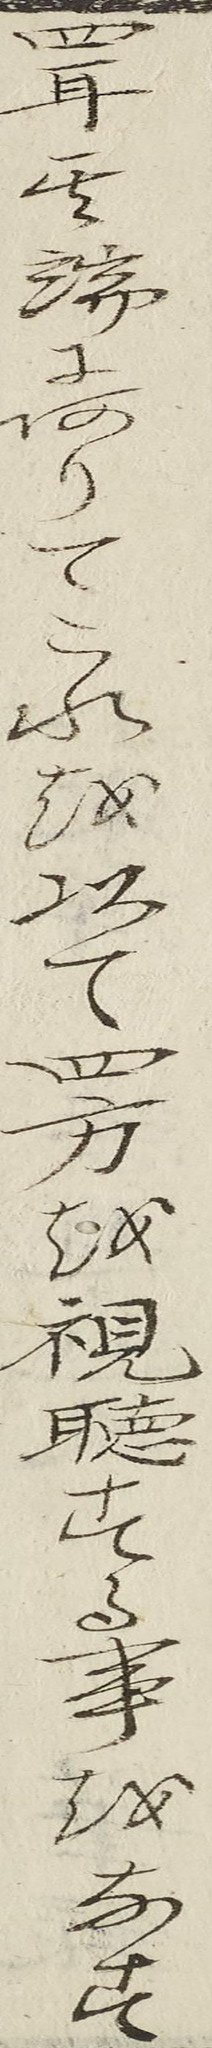四耳其端にありてこれを以て四方を視聴する事をなす
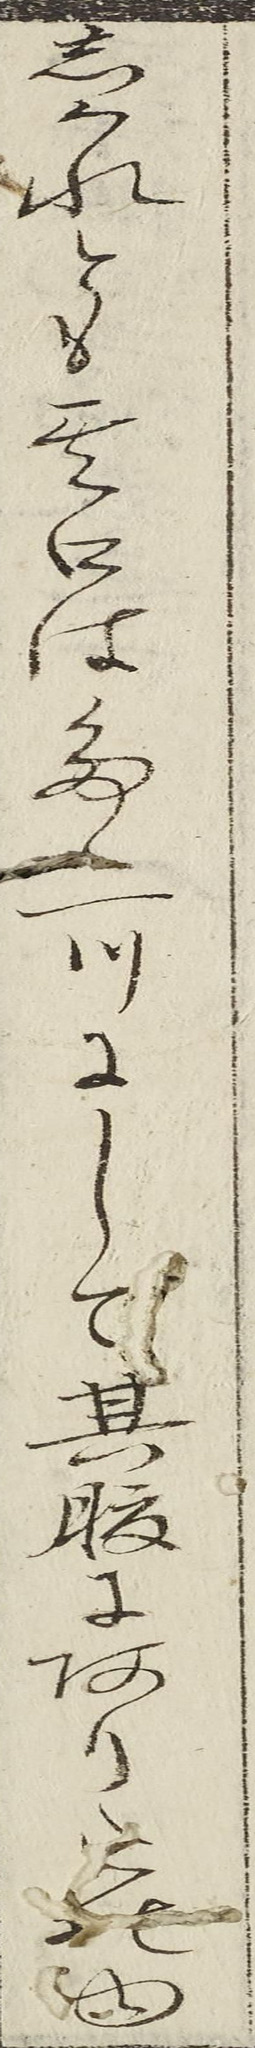しかれとも其口は多く一つにして其腹にありとのゆ
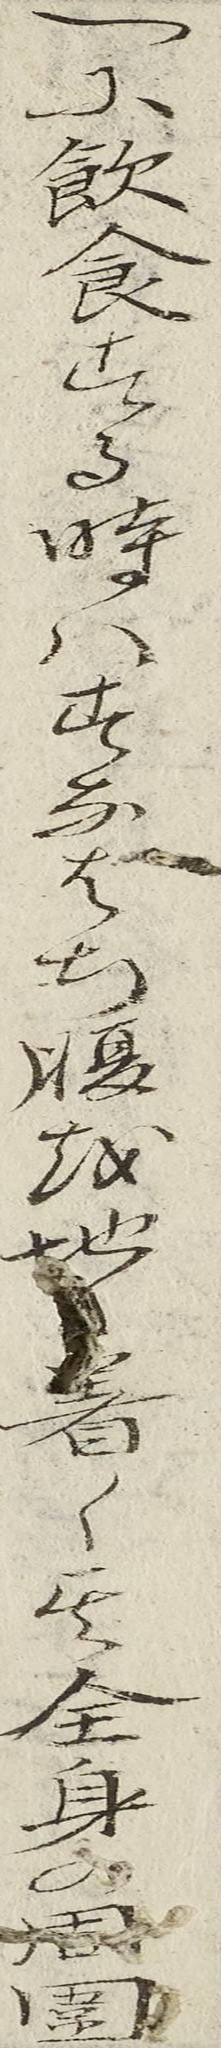へに飲食する時はすなはち腹を地に着く其全身の周囲
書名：西洋雜記　乾
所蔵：東京大学地震研究所図書室 Earthquake Research Institute Library, The University of Tokyo, JAPAN
